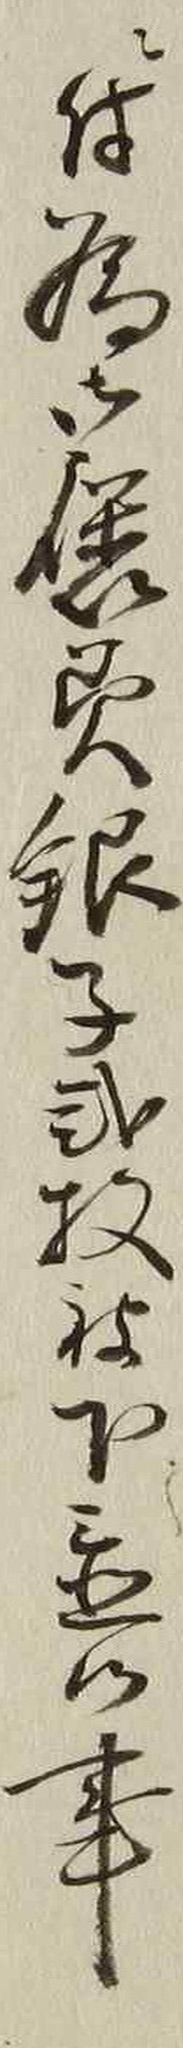ニ付為御褒美銀子弐枚被下置候事
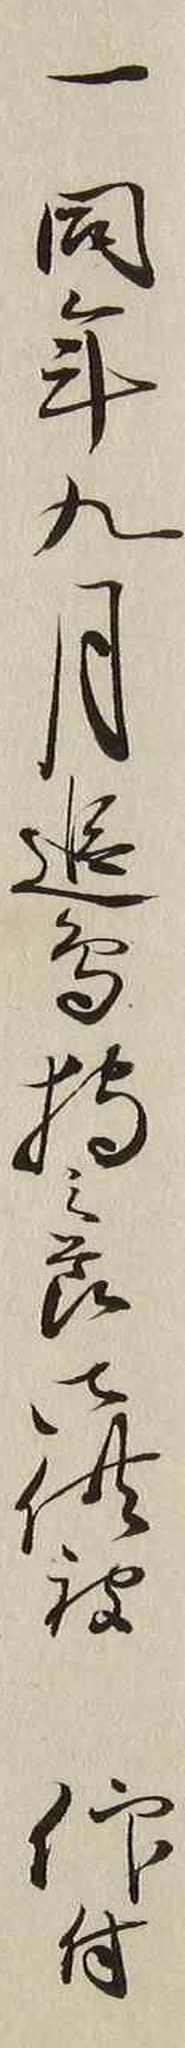一同年九月追鳥狩之節御供被仰付
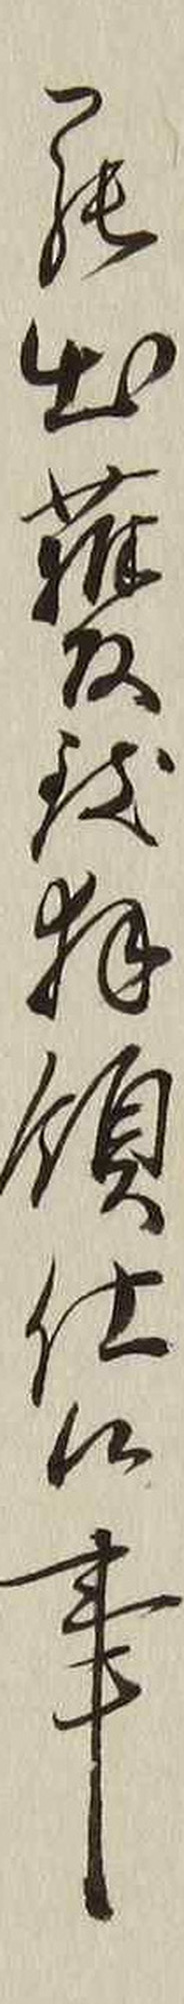罷出獲致拝領仕候事
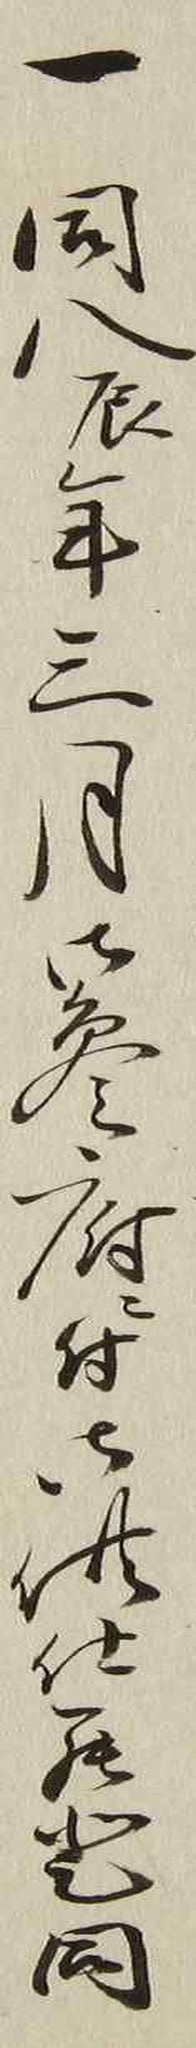一同八辰年三月御参府ニ付御供仕罷登同
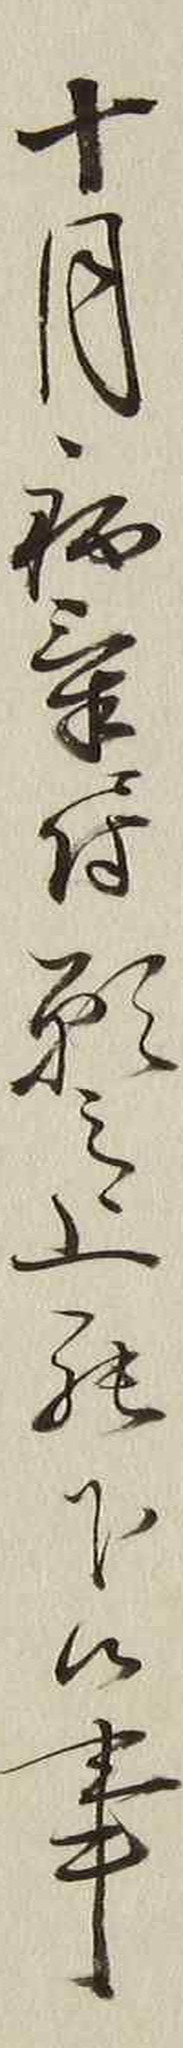十月病気ニ付願之上罷下候事
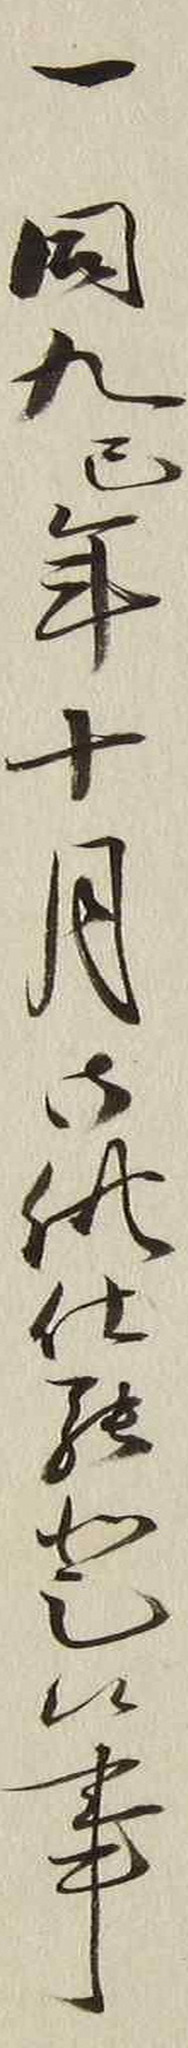一同九巳年十月御供仕罷登候事
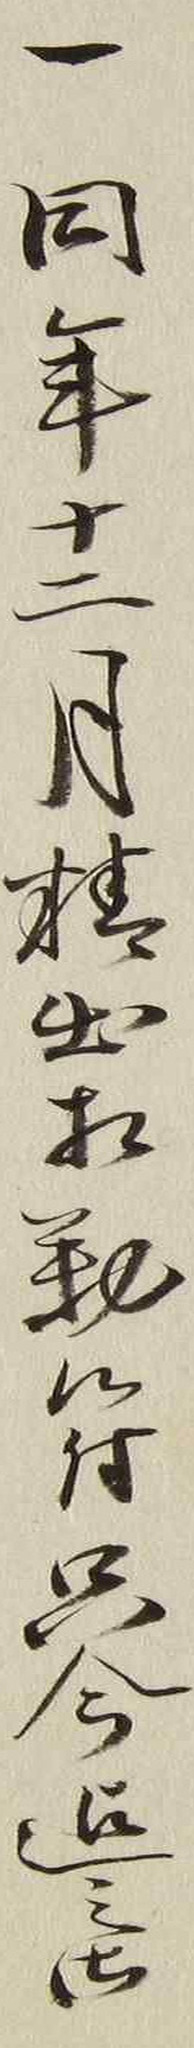一同年十二月精出相勤候ニ付只今迄之御
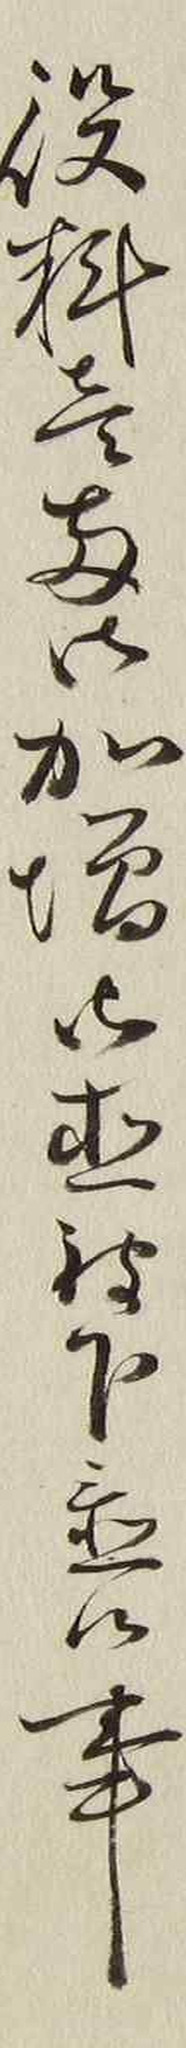役料壱両御加増御直被下置候事
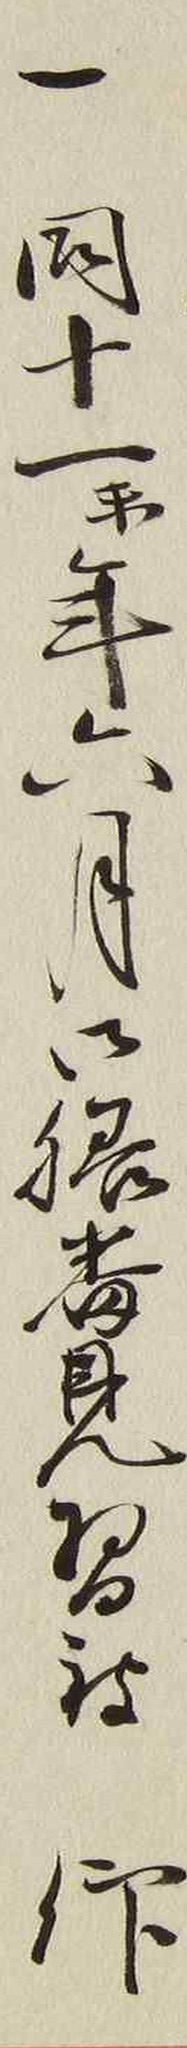一同十一未年六月御膳番見習被仰
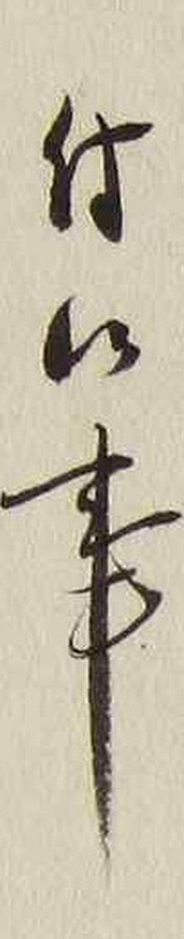付候事
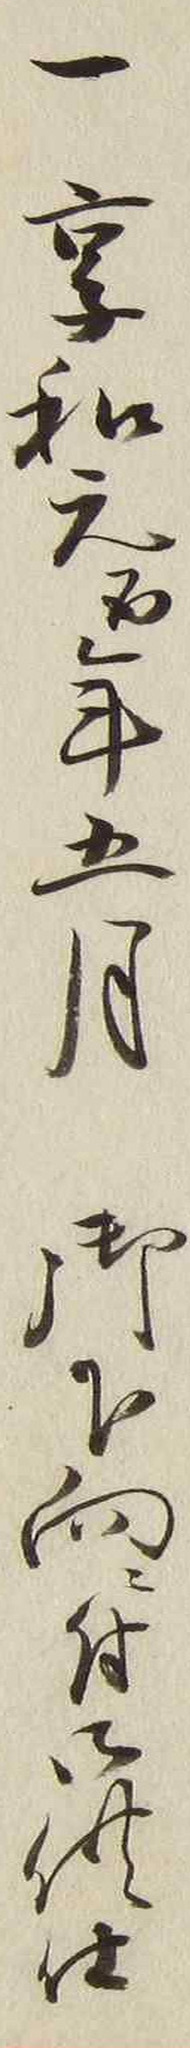一享和元酉年五月御下向ニ付御供仕

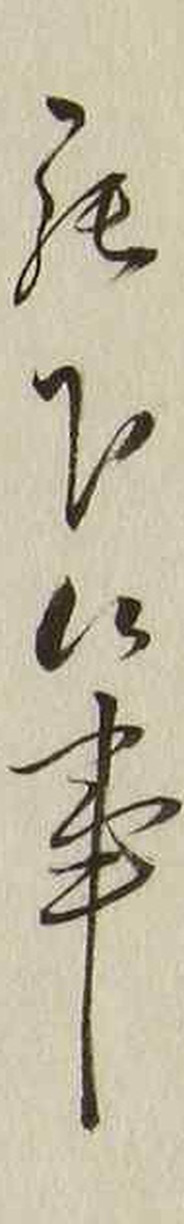罷下候事
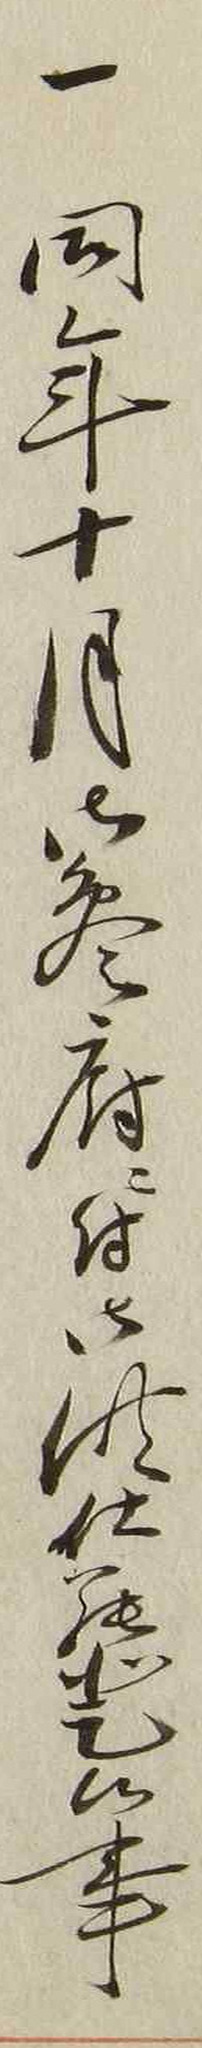一同年十月御参府ニ付御供仕罷登候事
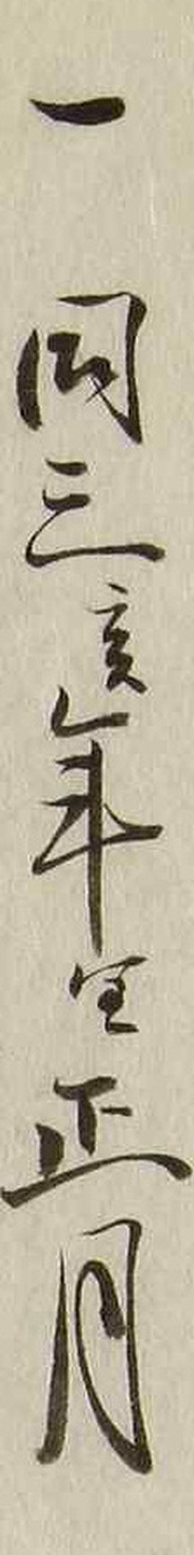一同三亥年閏正月
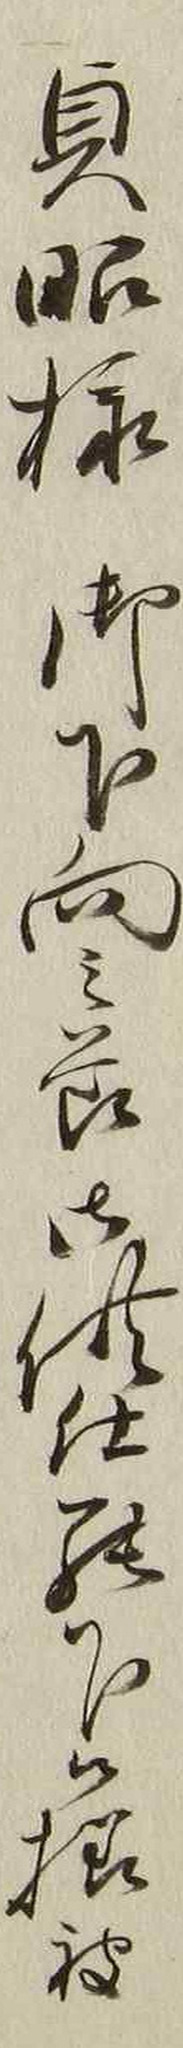貞昭様御下向之節御供仕罷下候様被
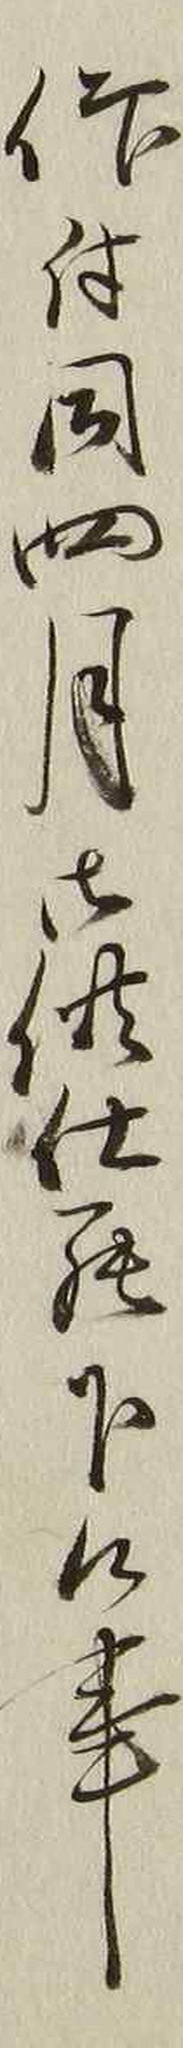仰付同四月御供仕罷下候事
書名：諸士系譜　巻之163　な之部5
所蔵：会津若松市立会津図書館
